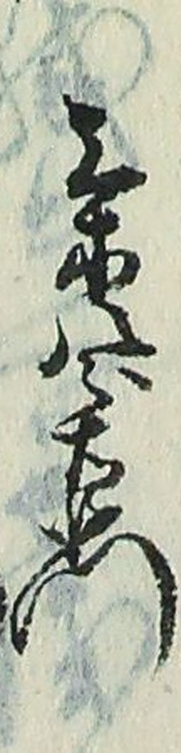三木八郎右衛門
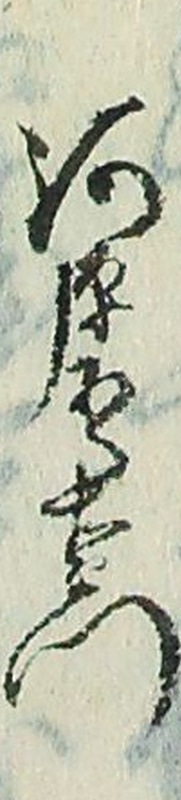河原五右衛門
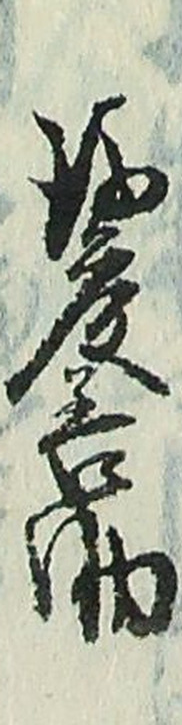後藤善助
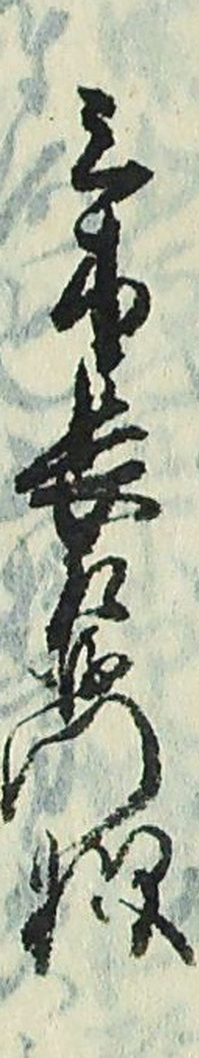三木長左衛門様
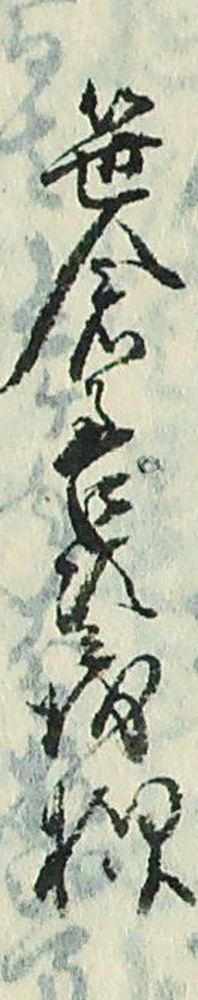笹倉善次兵衛様

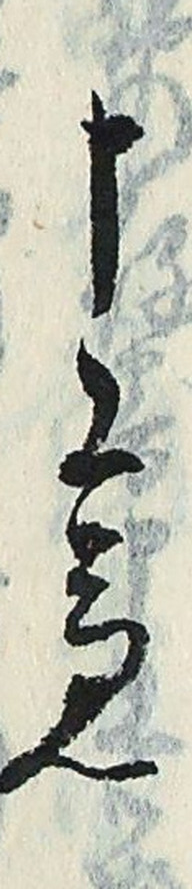申上覚
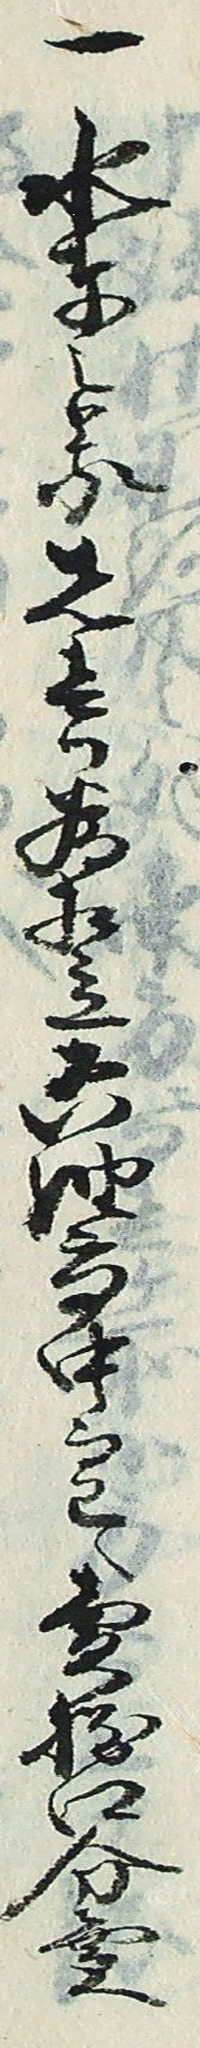一水車之義先壱つ為相立右油市中而已へ売捌郷分売
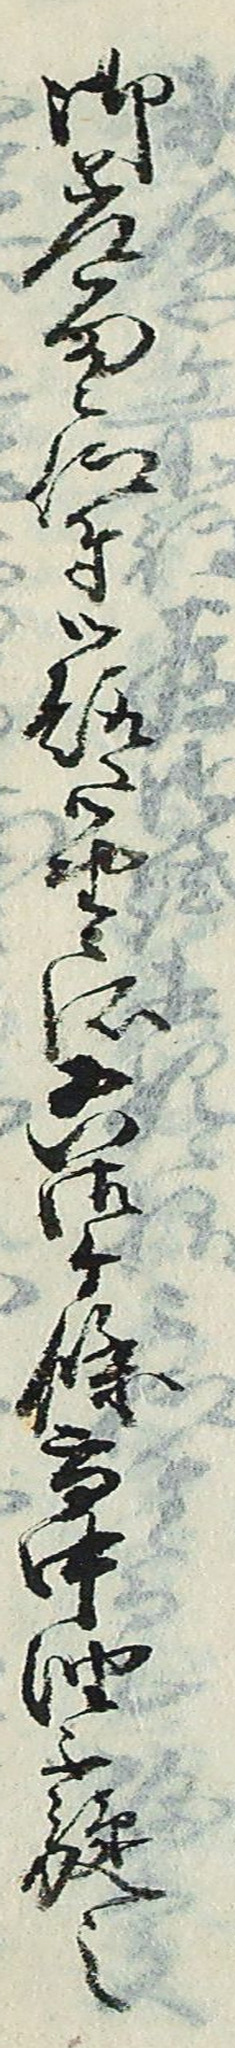御差留被仰付御趣に御坐候処右御ケ條市中油不健之
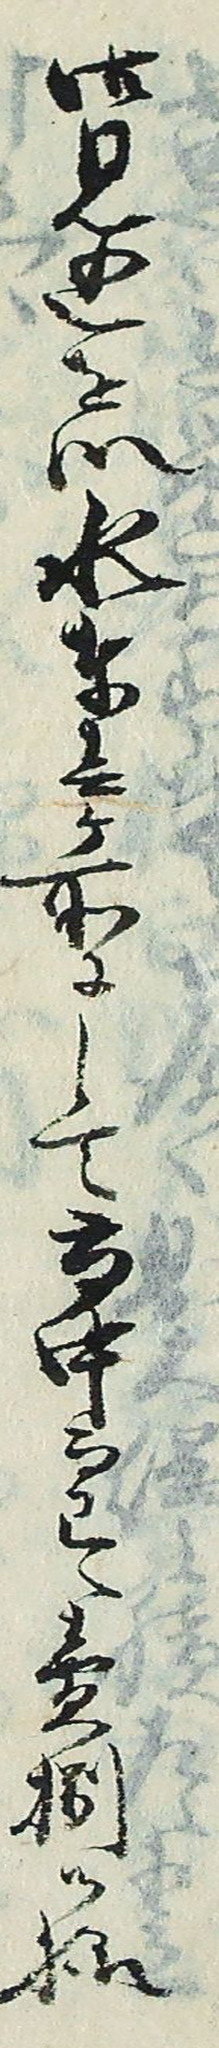御見込を以水車壱ケ所にして市中而已へ売捌候様
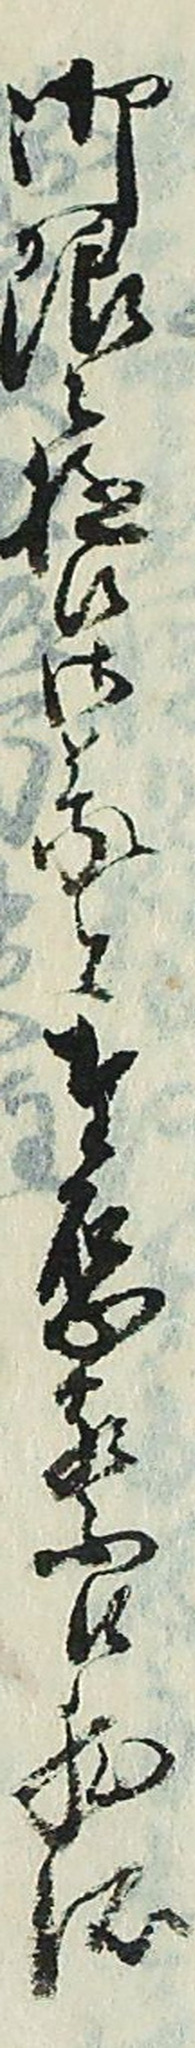御限被遊候御義と奉恐察候然所
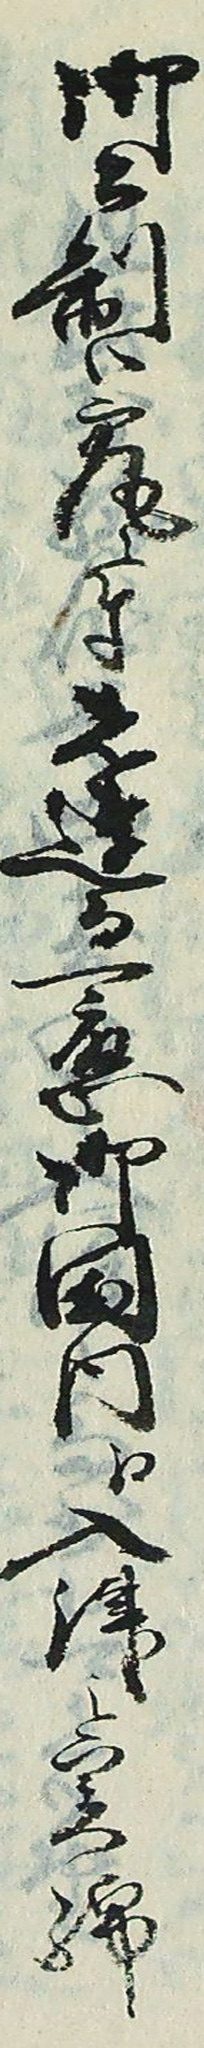御公制御究に付先達而一応御国内江入津之実綿
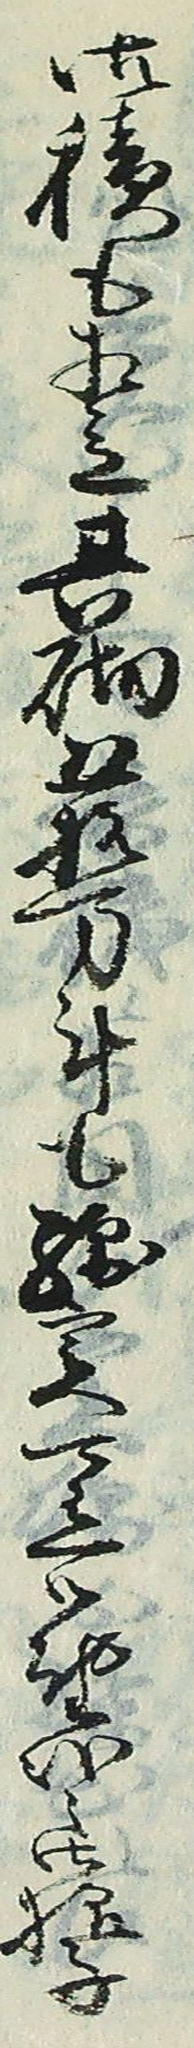御積も相立其砌五拾万計も綿実可有御坐哉之御様子
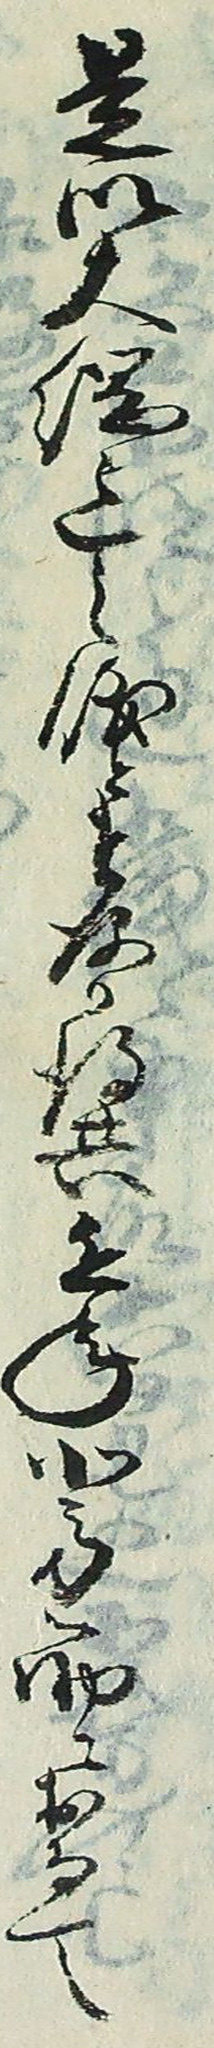是以大綱迄之儀と奉存候得共近年北方筋におゐて
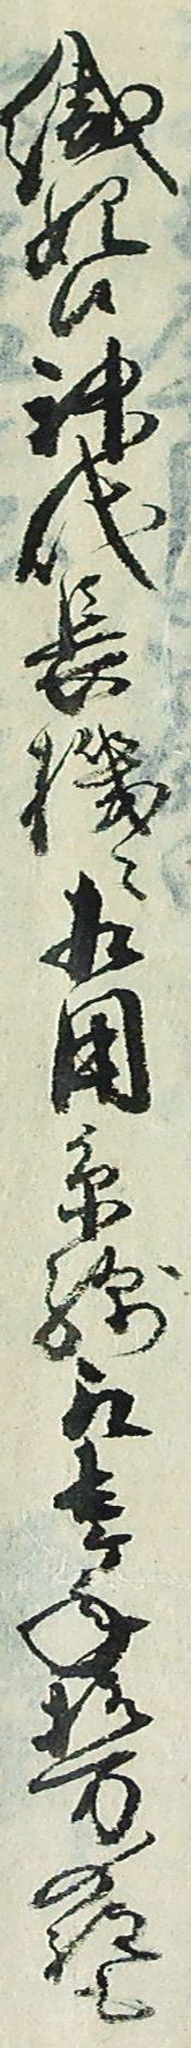織始候神代長機に相用糸綿凡壱ケ年拾万〆程も
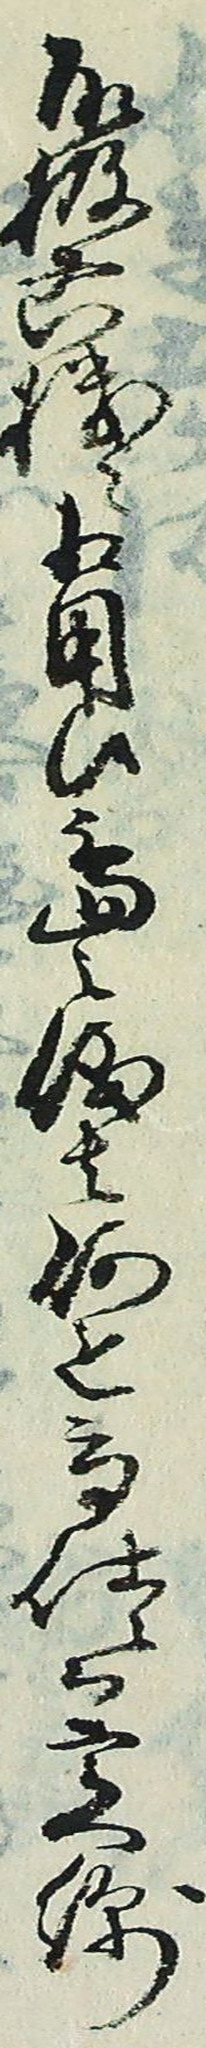取扱右機に相用候島の儀者何れ商仕に而実綿
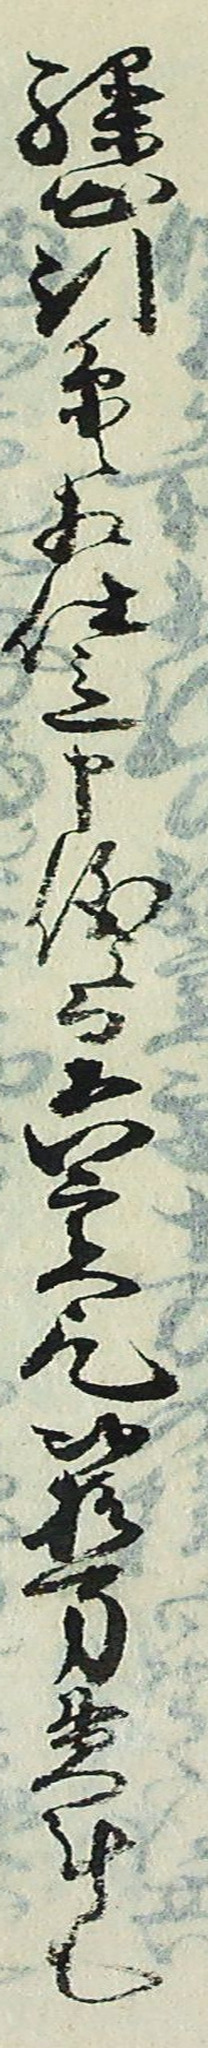繰出引糸に相仕立申儀に而右実凡弐拾万貫計も
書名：油稼御取究ニ附御箇條書テ以被仰渡南北同役申談御答書控
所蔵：鳴門教育大学 Naruto University of Education
